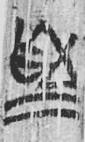爲
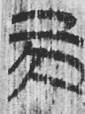天
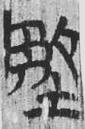○（地）
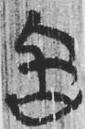旨
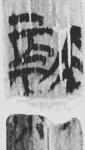○（握）
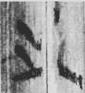之
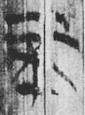不
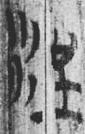浧（盈）
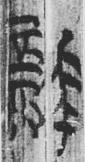○（握）
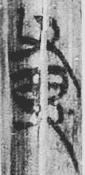尃
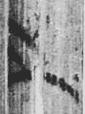之
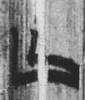亡（無）
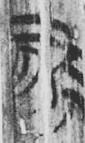所
